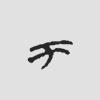于
